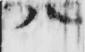八
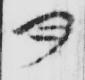月
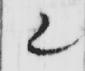乙
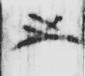之
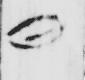日
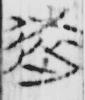遠
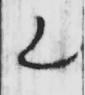乙
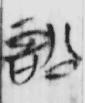訟
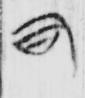司
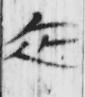衣
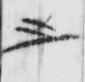之
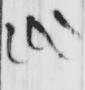州
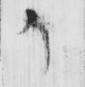人
